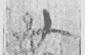廿
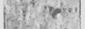一
